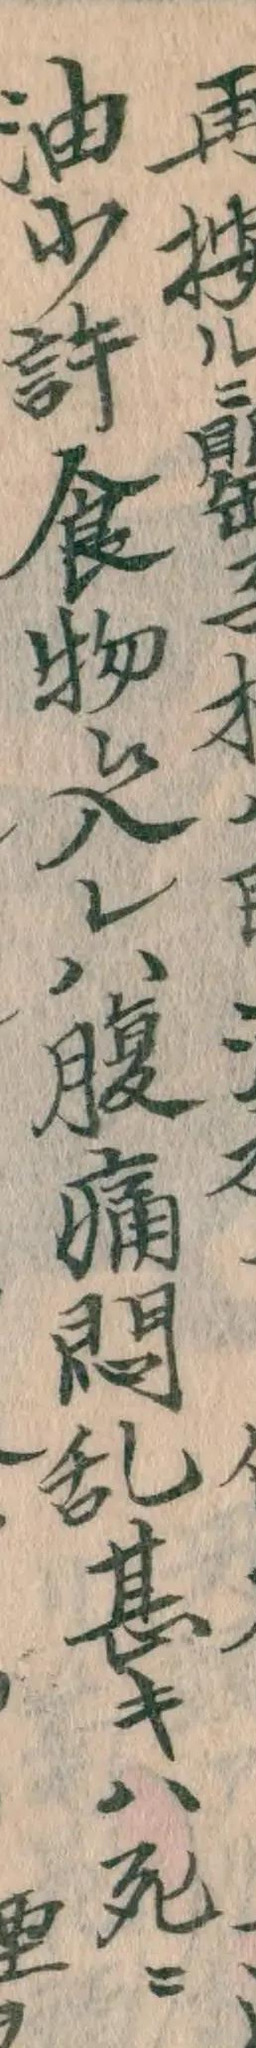油少許食物エ入レハ腹痛悶乱甚キハ死ニ
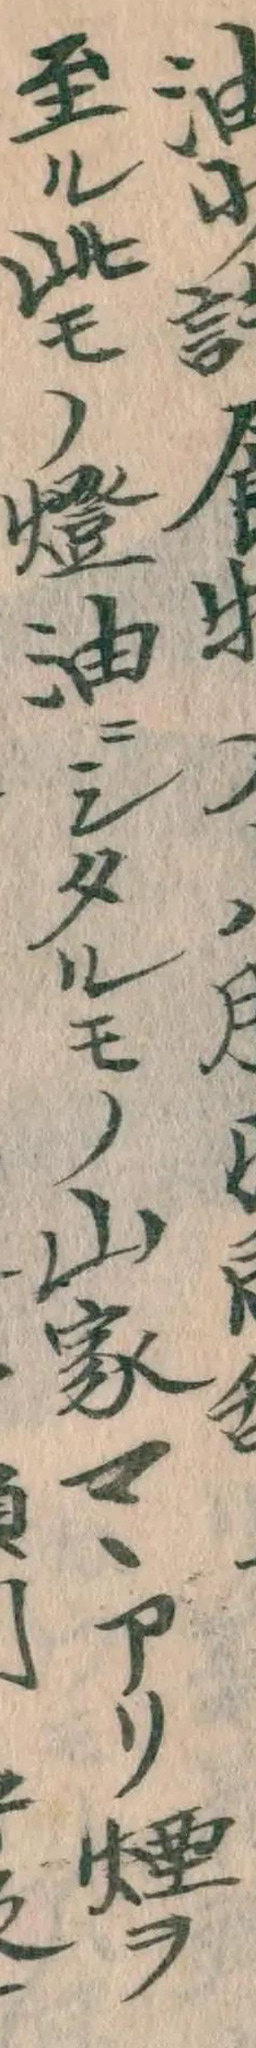至ル此モノ燈油ニシタルモノ山家マヽアリ煙ヲ
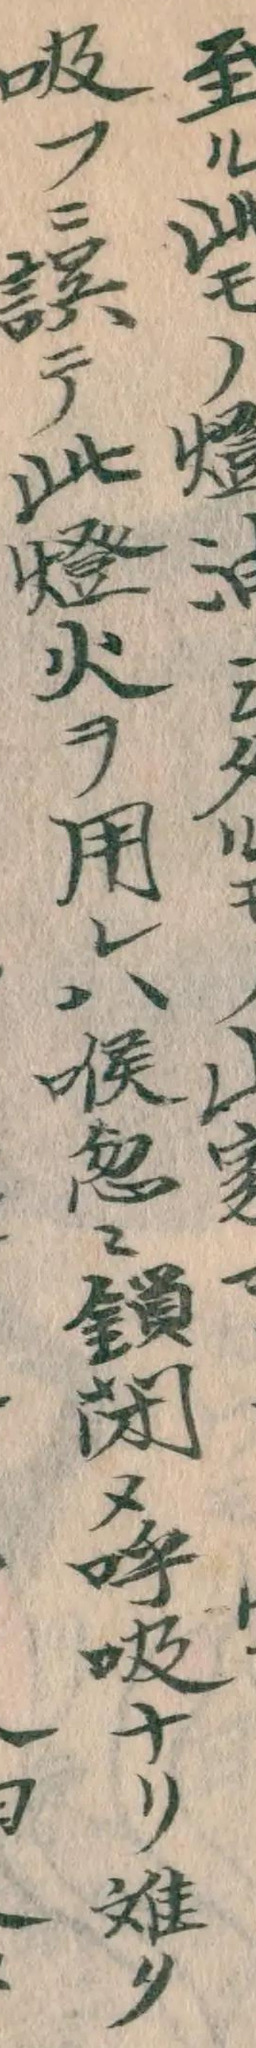吸フニ誤テ此燈火ヲ用レハ喉忽ニ鎖閉シテ呼吸ナリ難ク
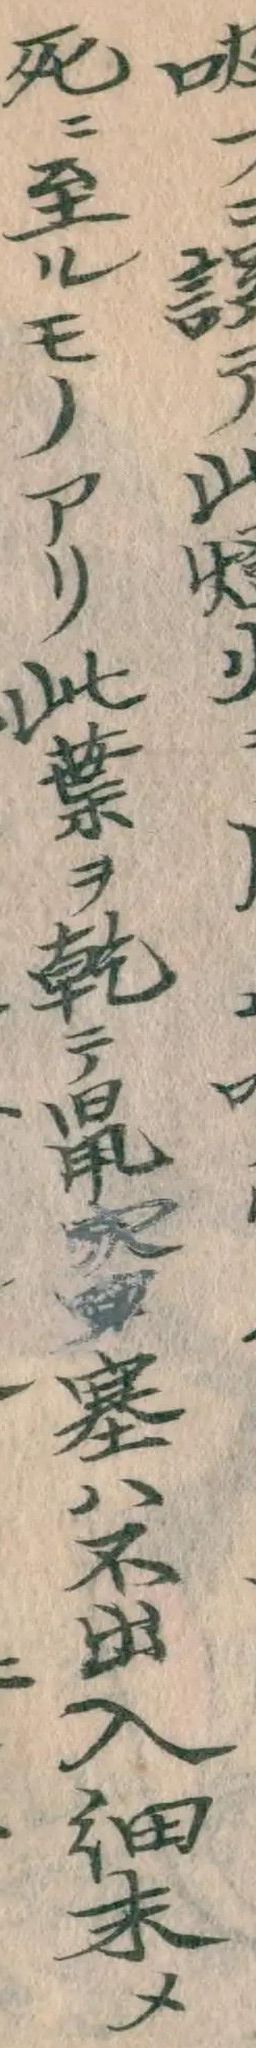死ニ至ルモノアリ此葉ヲ乾テ鼠塞ハ不出入細末シテ
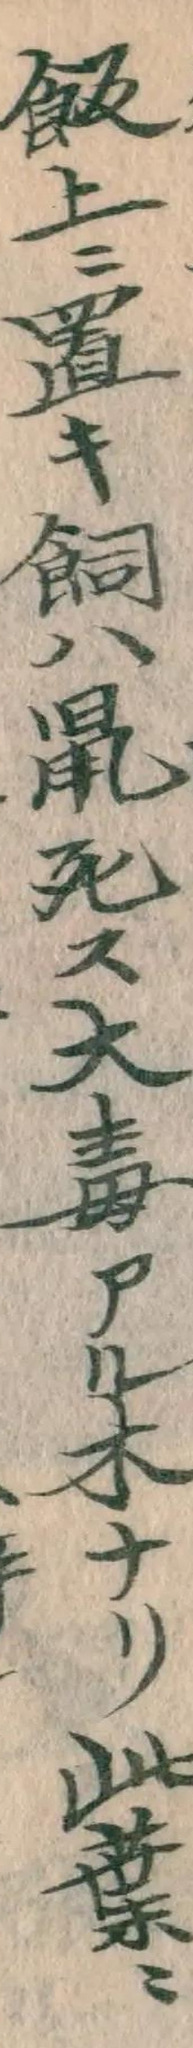飯上ニ置キ飼ハ鼠死ス大毒アル木ナリ此葉ニ
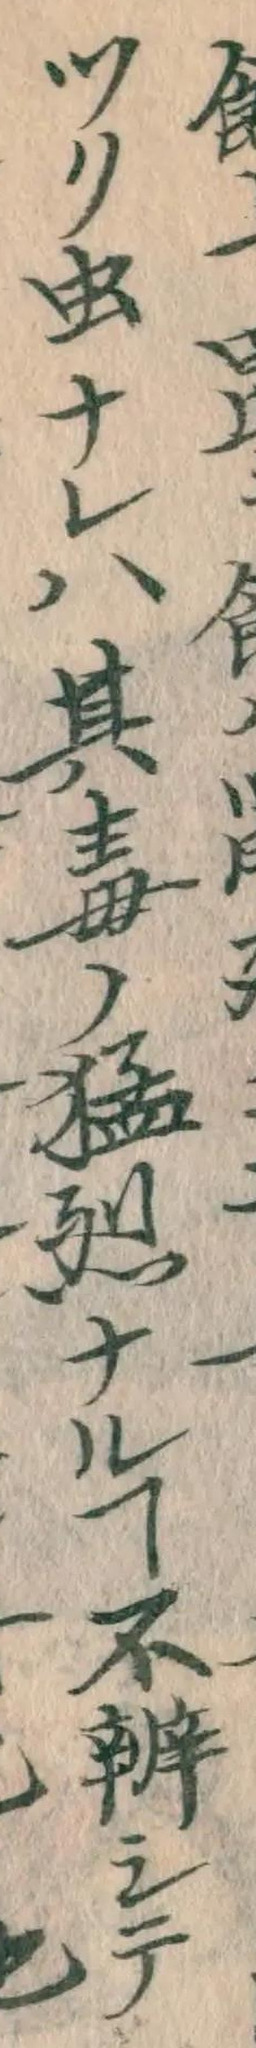ツク虫ナレハ其毒ノ猛烈ナルコト不辨シテ
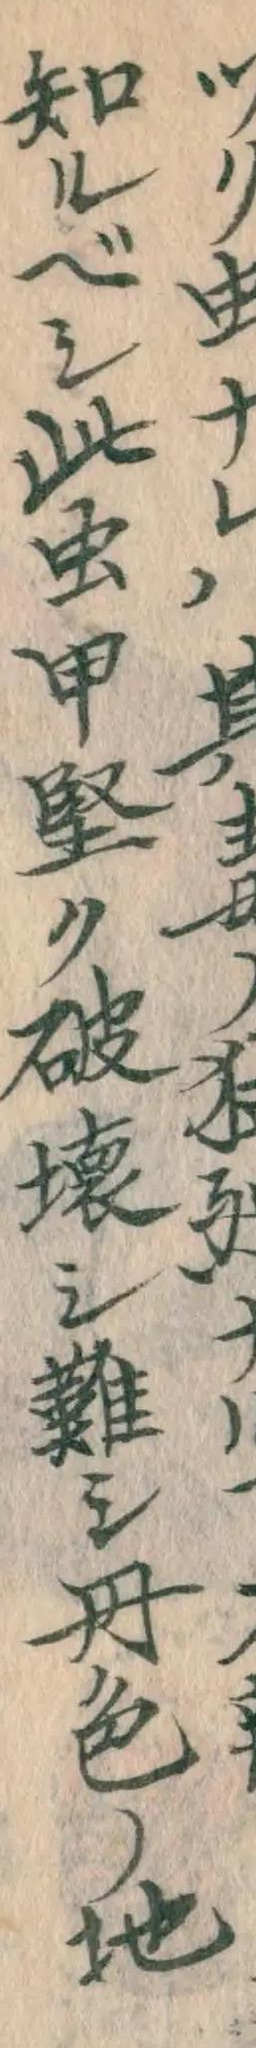知ルベシ此虫甲堅ク破壊シ難シ丹色ノ地
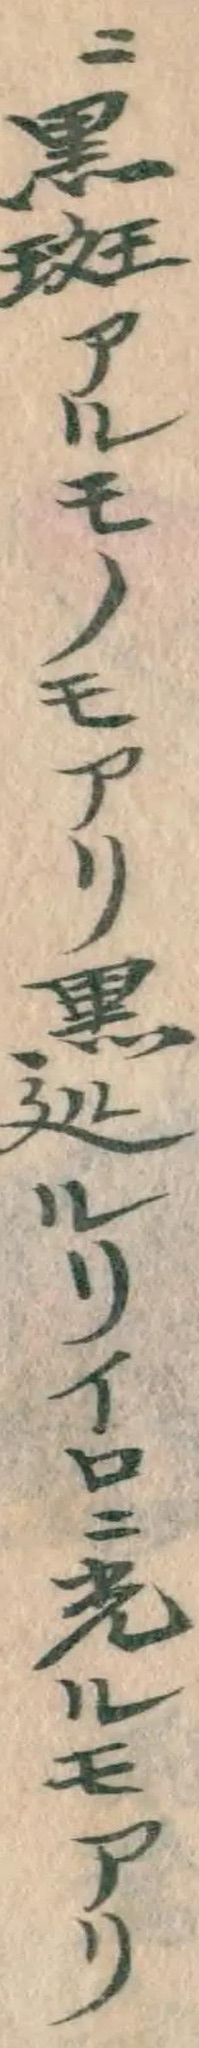ニ黒斑アルモノモアリ黒処ルリイロニ光ルモアリ
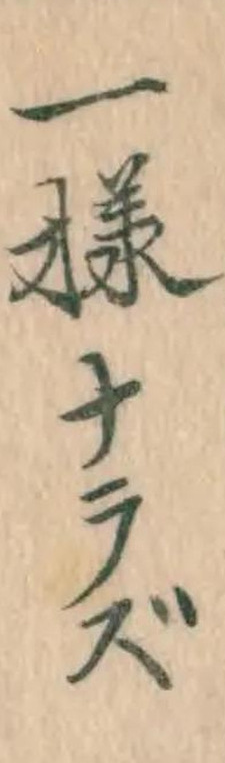一様ナラズ

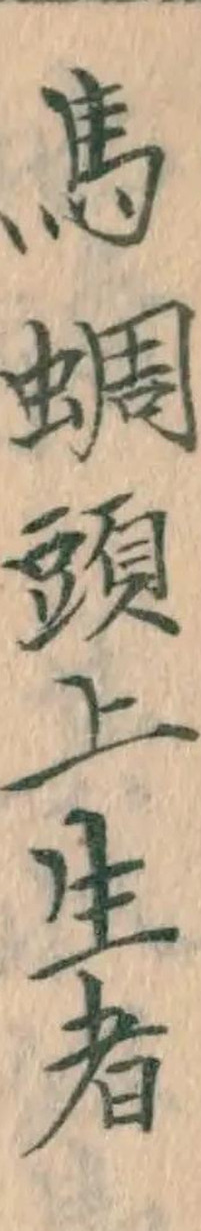馬蜩頭上生者
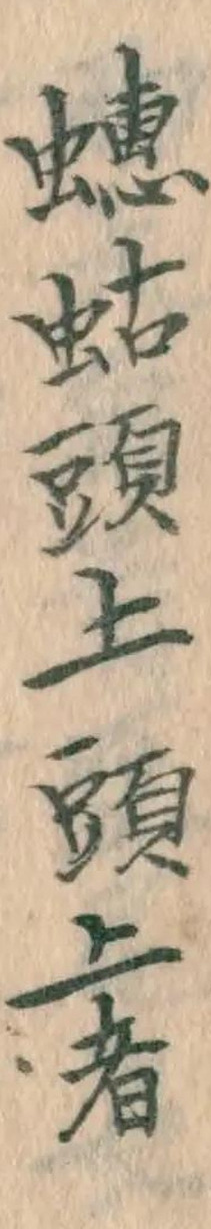蟪蛄頭上頭上者
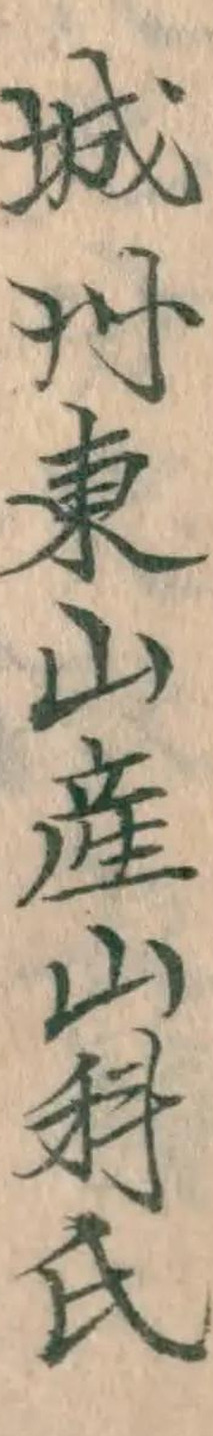城州東山産山科氏
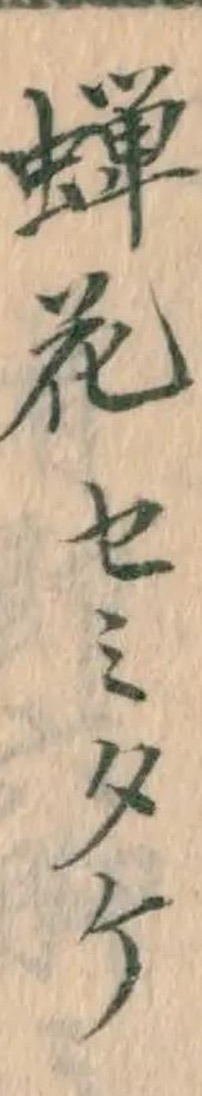蝉花セミタケ
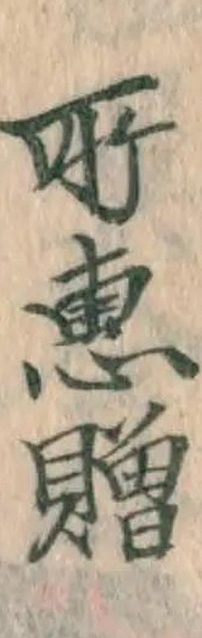所恵贈
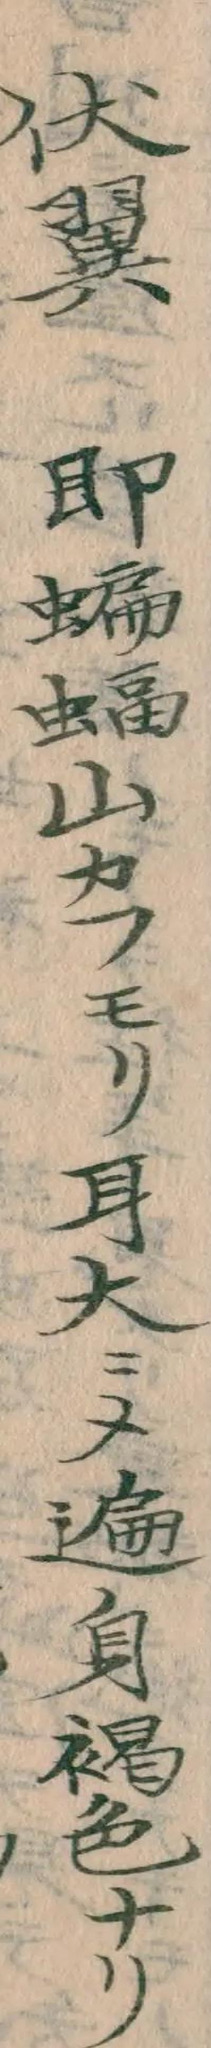伏翼即蝙蝠山カフモリ耳大ニシテ遍身褐色ナリ
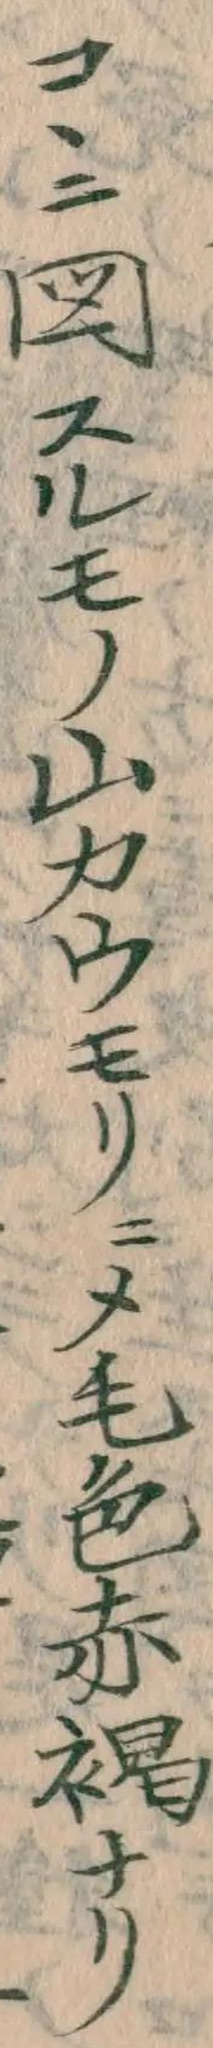コヽニ図スルモノ山カウモリニシテ毛色赤褐ナリ
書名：千蟲譜 3巻. [3]
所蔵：国立国会図書館 National Diet Library, JAPAN
